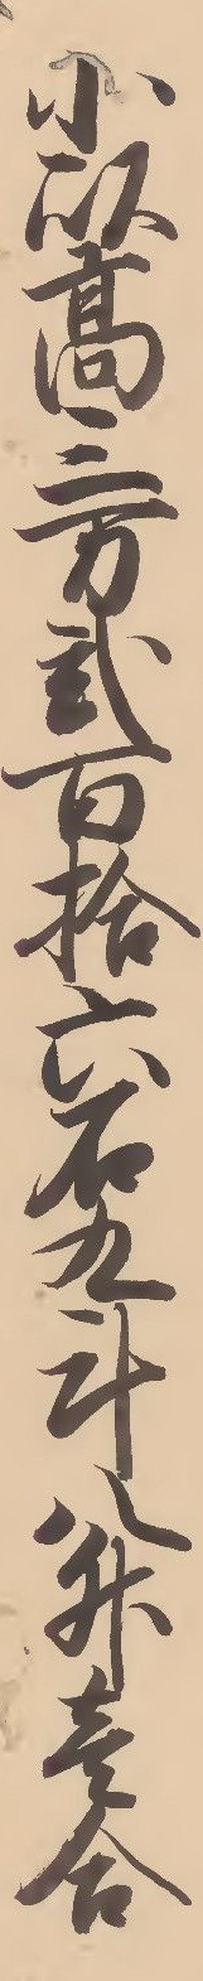小以高三万弐百拾六石九斗八升壱合

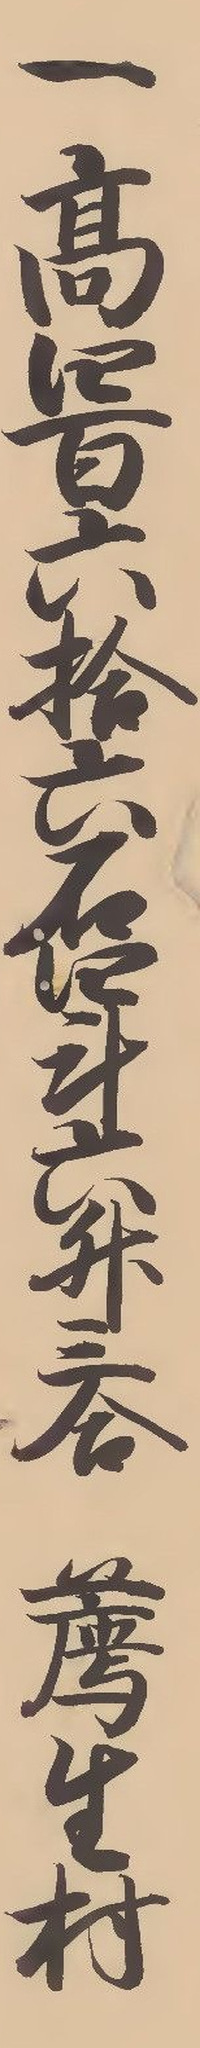一高四百六拾六石四斗六升三合薦生村
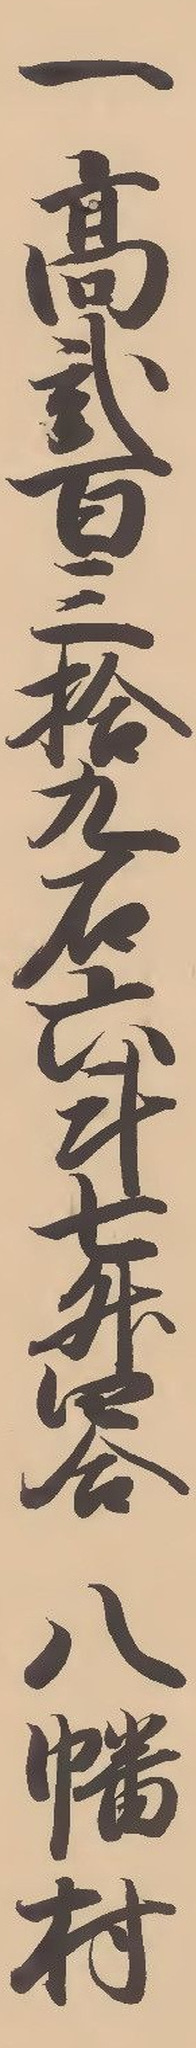一高弐百三拾九石六斗七升四合八幡村
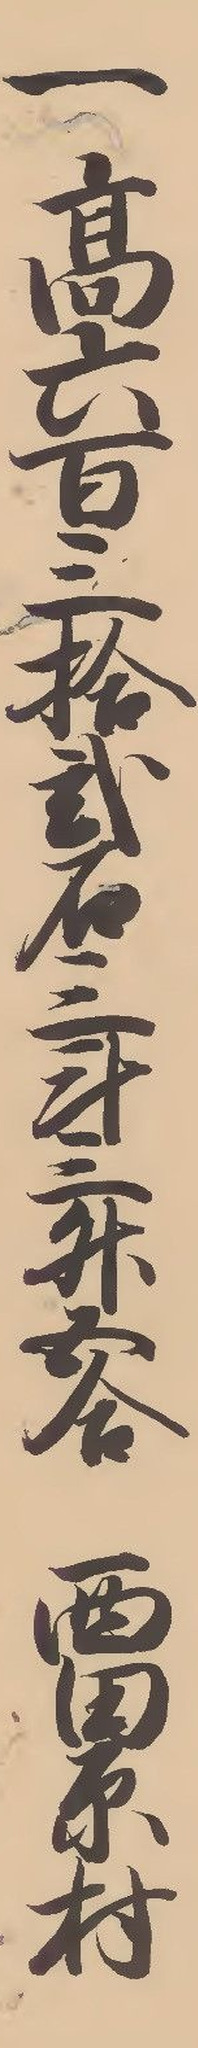一高六百三拾弐石三斗三升五合西田原村

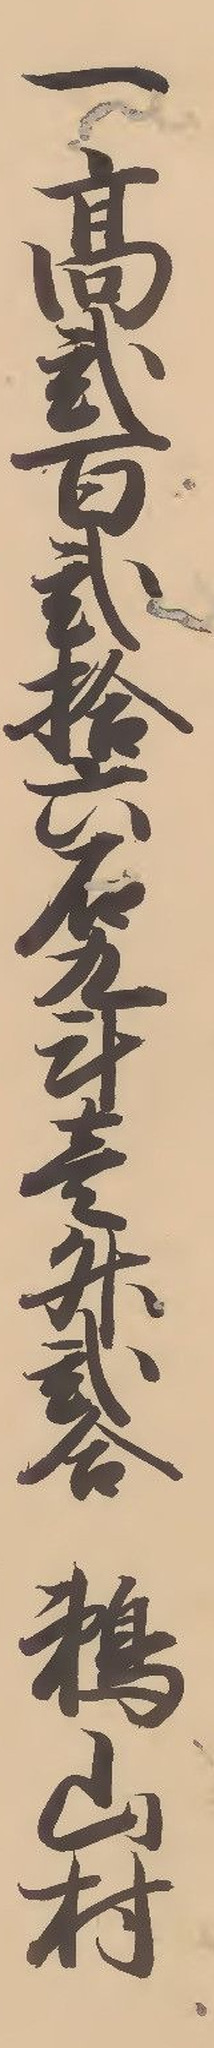一高弐百弐拾六石九斗壱升弐合鵜山村
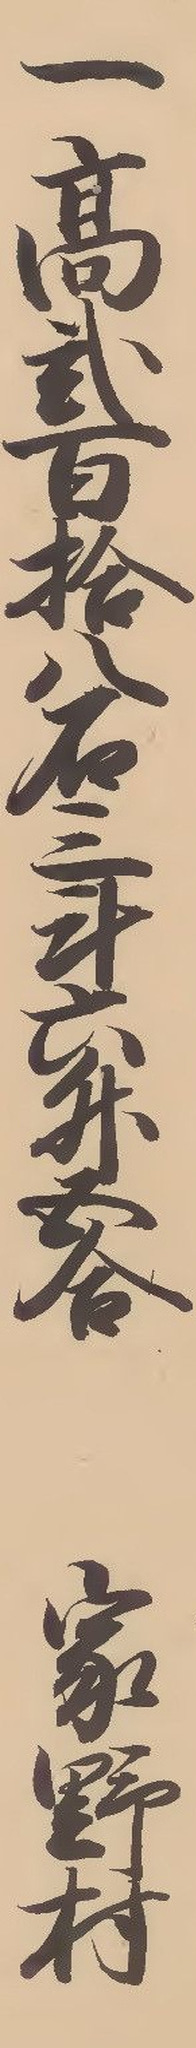一高弐百拾八石三斗六升五合家野村
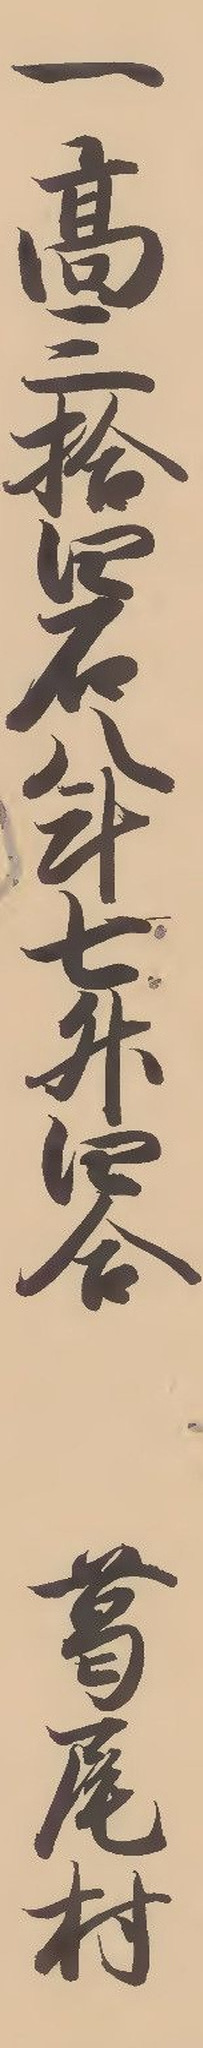一高三拾四石八斗七升四合葛尾村
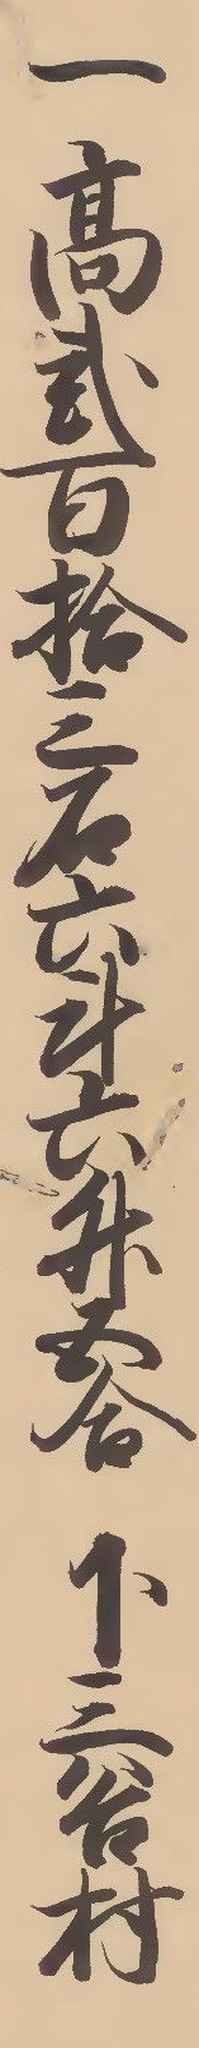一高弐百拾三石六斗六升五合下三谷村
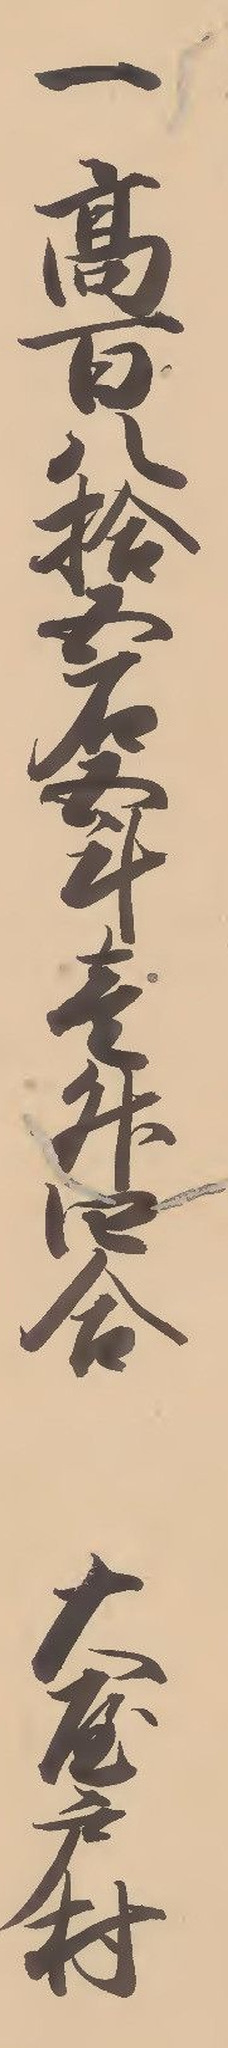一高百八拾五石五斗壱升四合大屋戸村
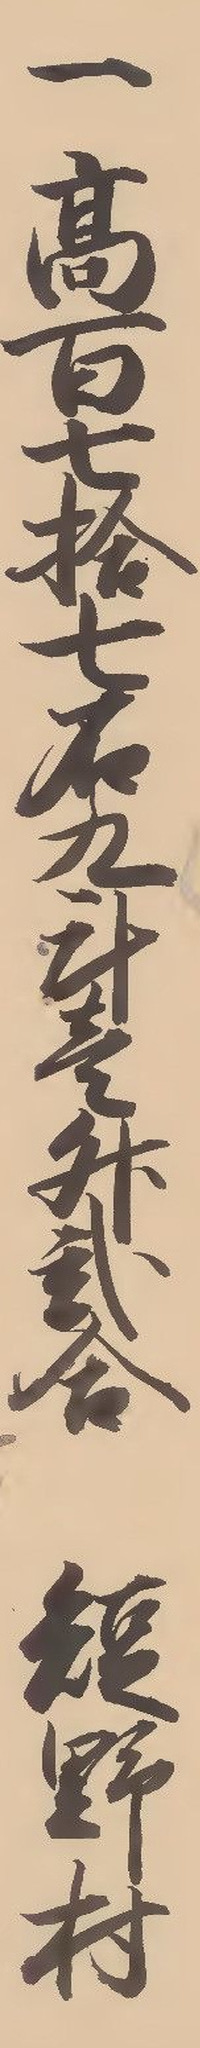一高百七拾七石九斗壱升弐合短野村
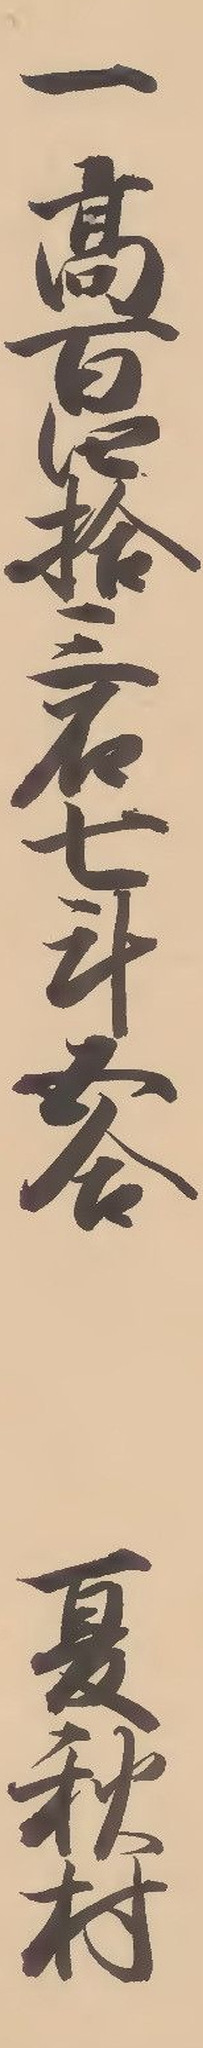一高百四拾三石七斗五合夏秋村
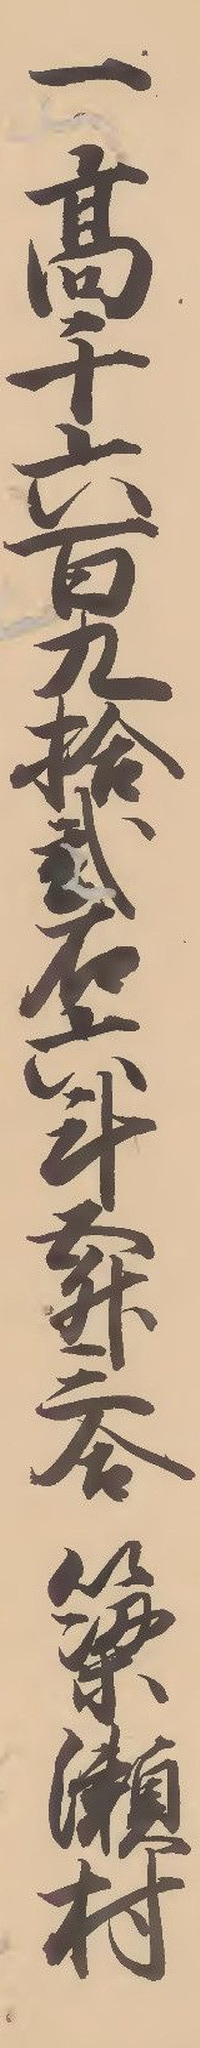一高千六百九拾弐石六斗五升三合簗瀬村

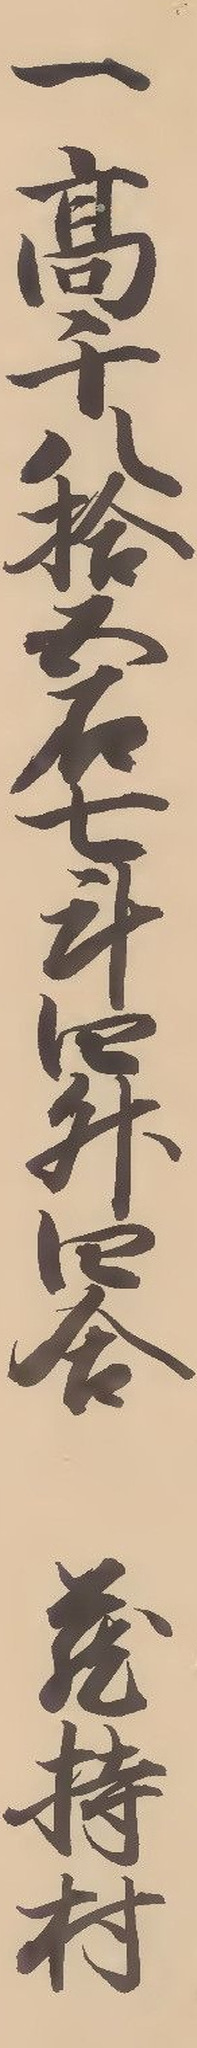一高千八拾五石七斗四升四合蔵持村
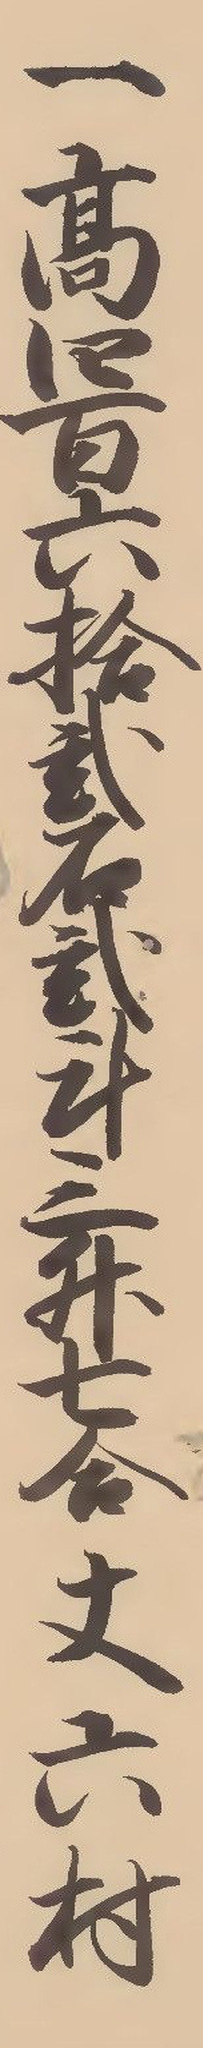一高四百六拾弐石弐斗三升七合丈六村
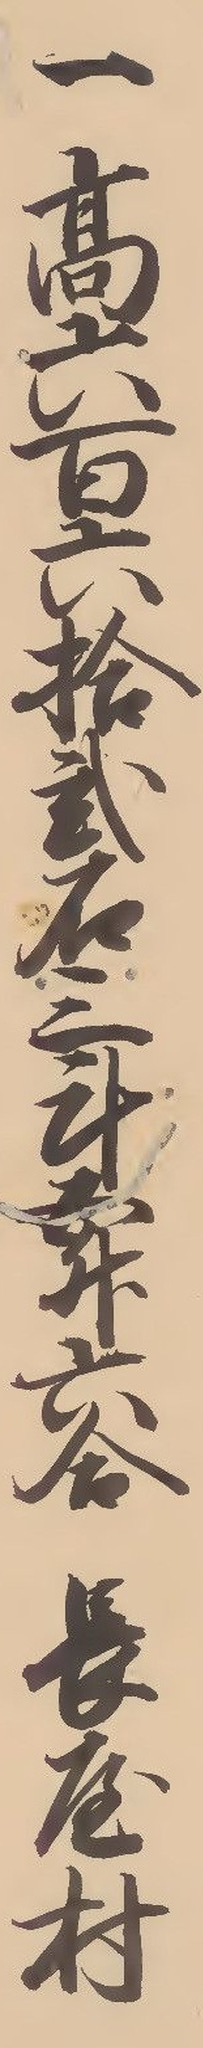一高六百六拾弐石三斗五升六合長屋村
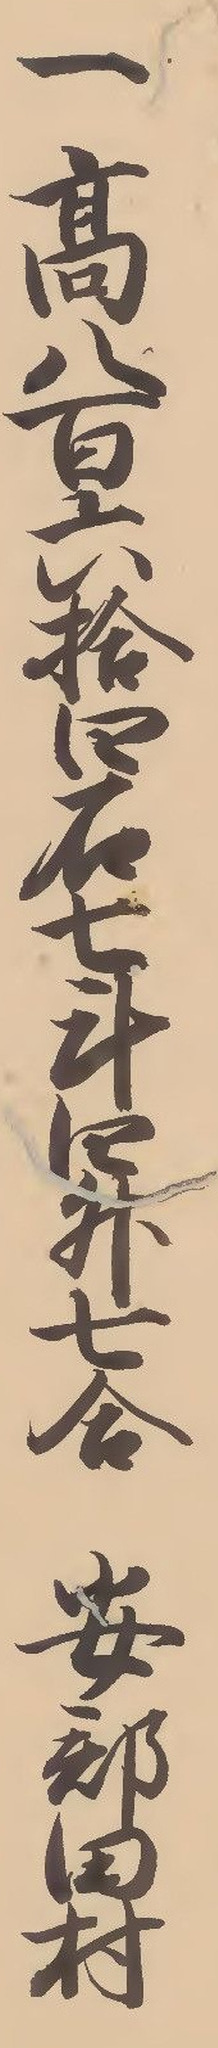一高八百六拾四石七斗四升七合安部田村
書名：伊賀国郷帳
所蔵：国立公文書館 National Archives of Japan
